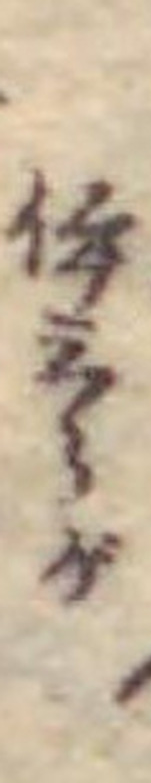伊三郎が
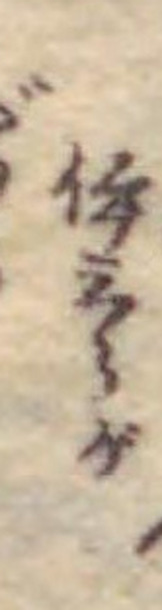伊三郎が
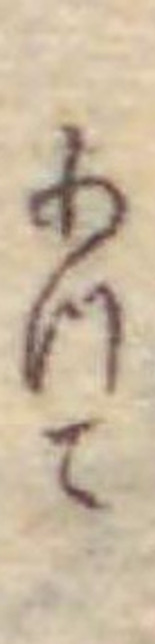あつて

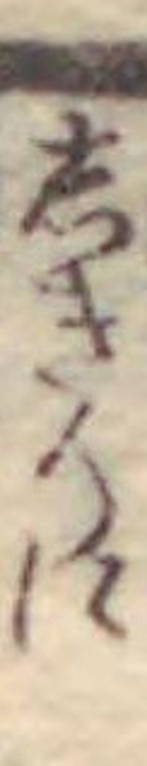しきりに
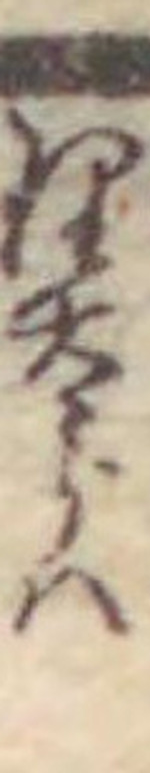理太郎は
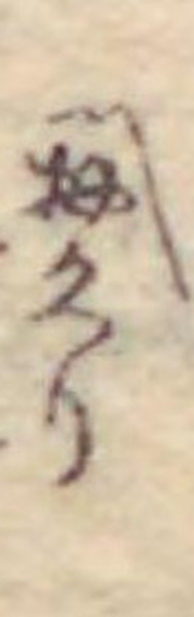〽おかへり
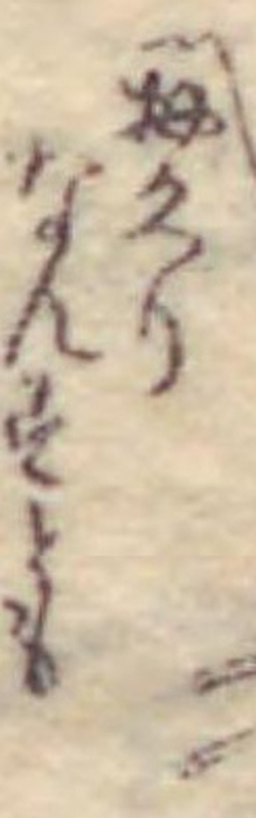なんすとも
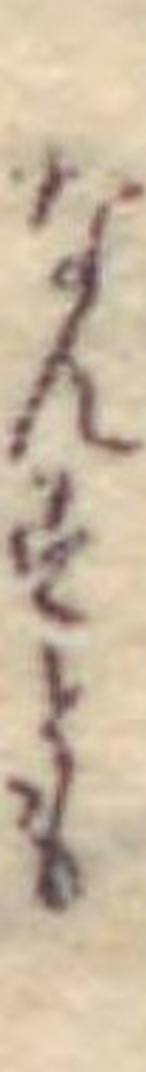なんすとも
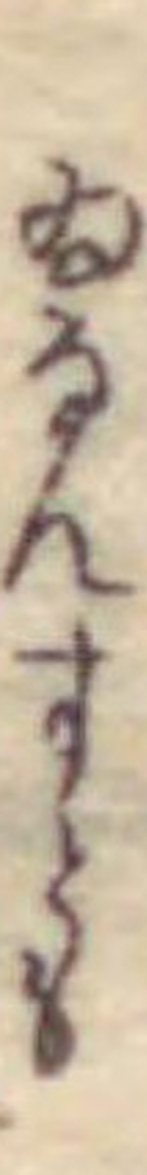ゐなんすとも
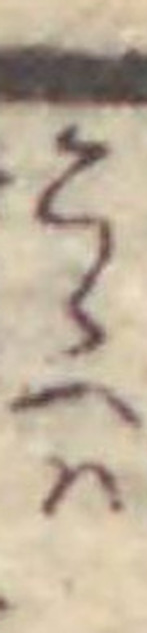こゝへは
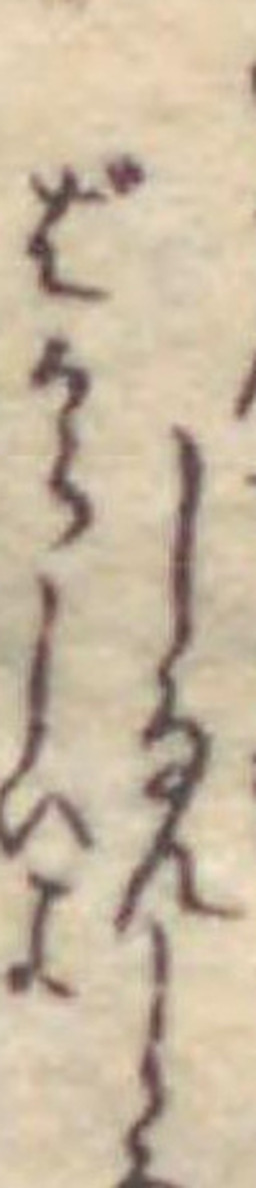ばからしいよ
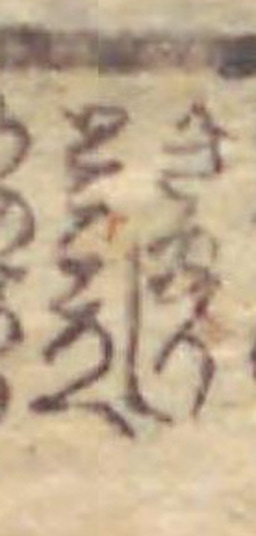ところへ
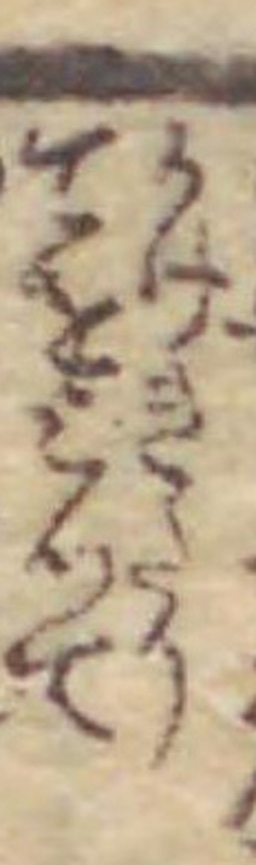てをとつて
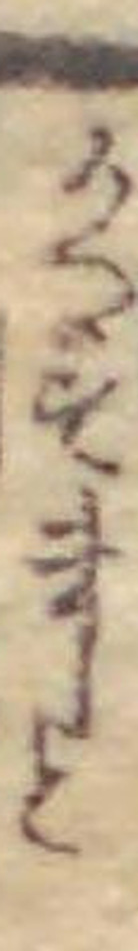あへすましと
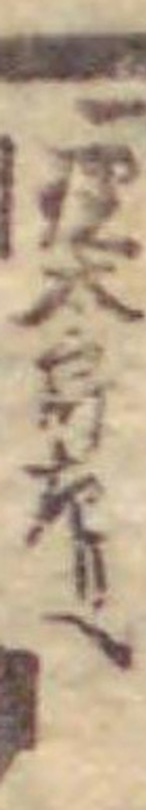〽理太郎左りへ
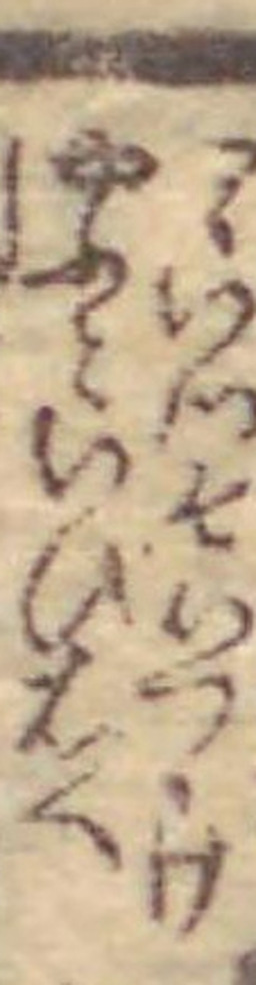やふといひ右へ
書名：心学早染艸 : 3巻
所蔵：国立国会図書館 National Diet Library, JAPAN
